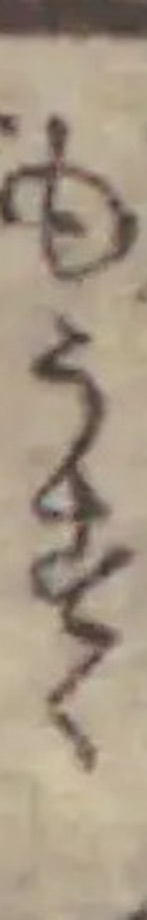もうすく
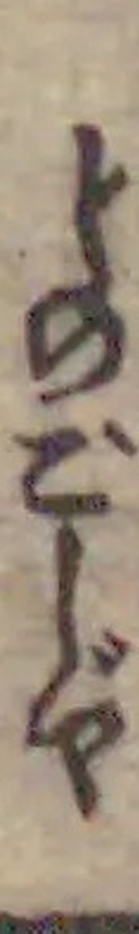とのごじや
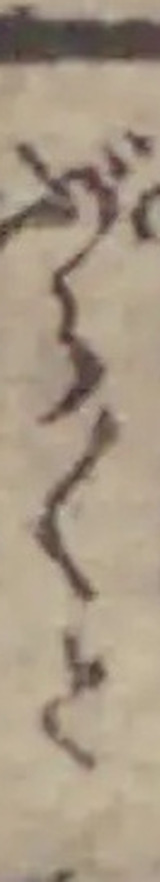ぶら〳〵と
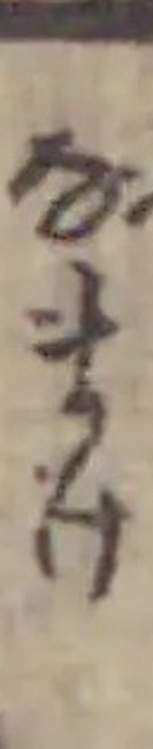なまけ
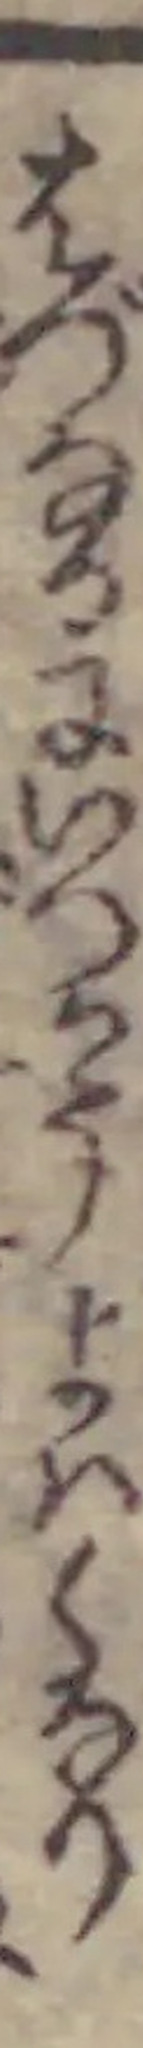はづなるにいつかよはくなり
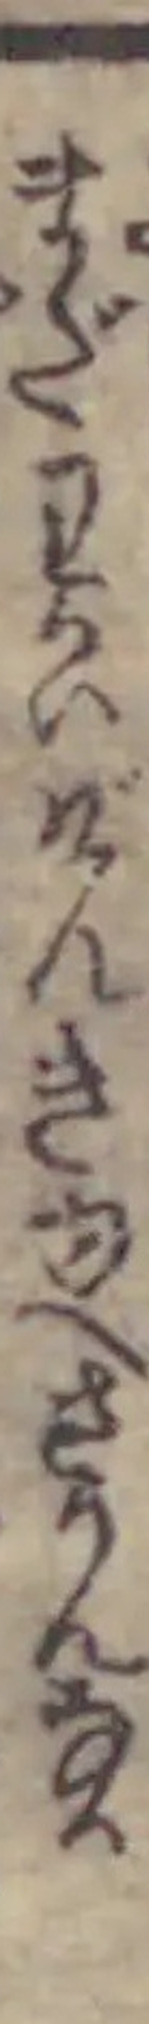まだわかいげんきゆへさかんな
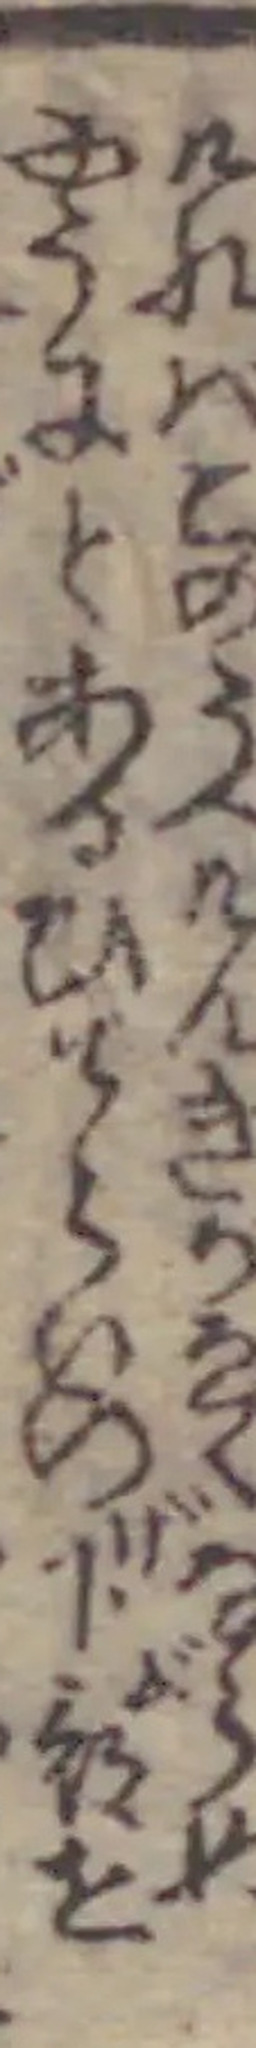やうにとあるひけらいの下部を
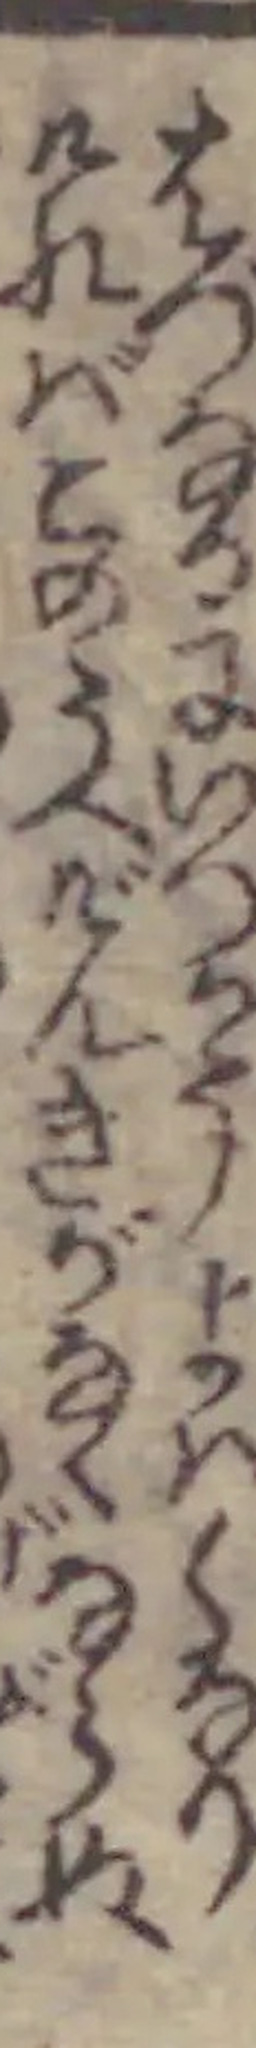ければこのうへげんきがなくならぬ
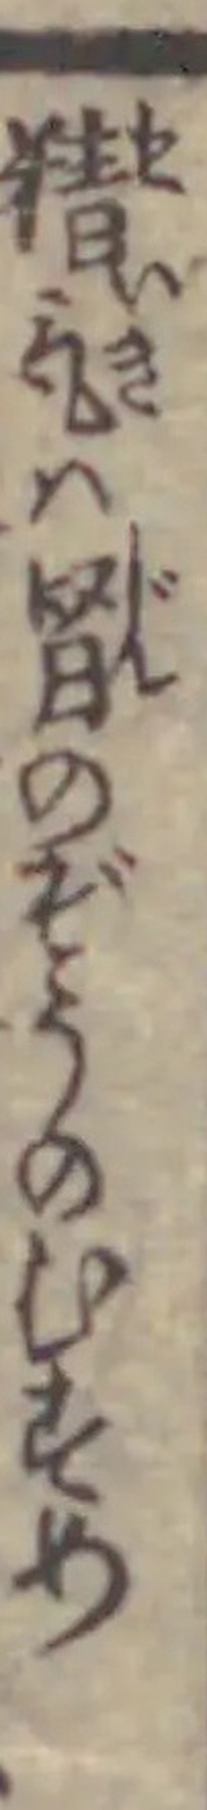精気は腎のぞうのむすめ
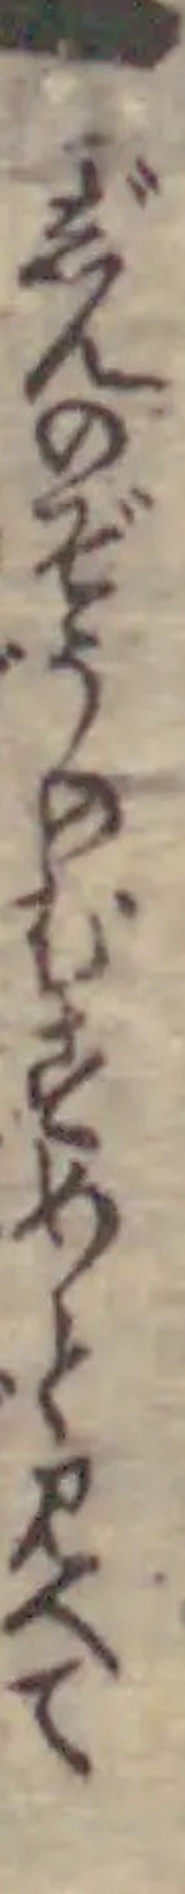じんのぞうのむすめと見へて
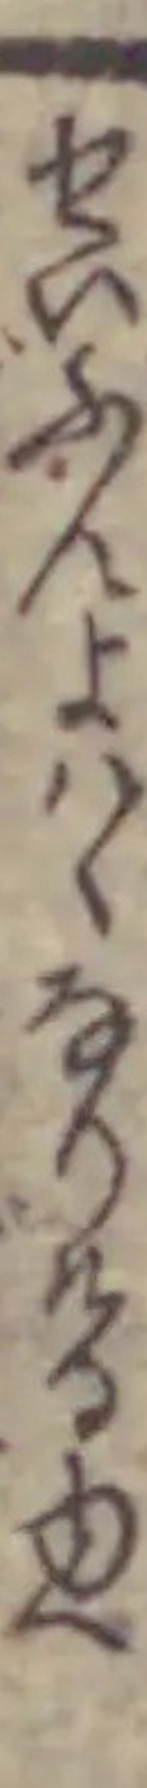せいぶんよはくなりけるゆへ
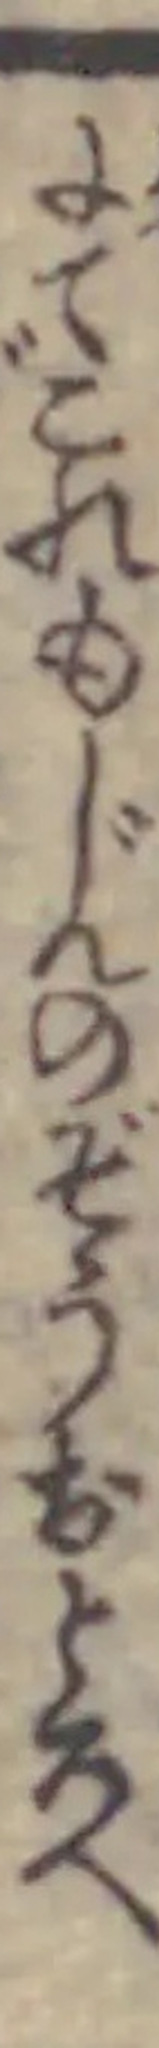にてこれもじんのぞうおとろへ
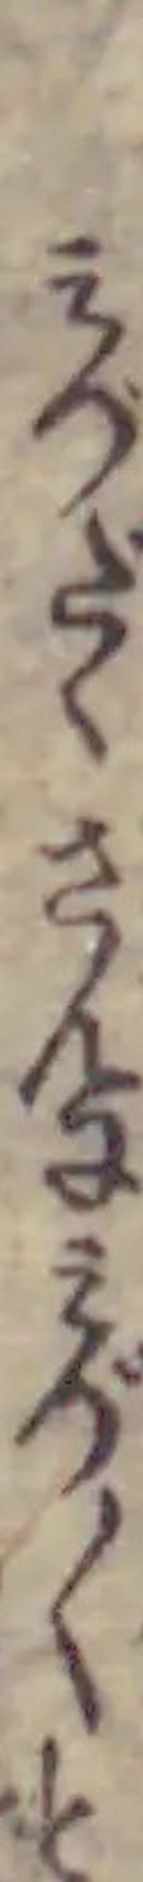みづだくさんにみづ〳〵と
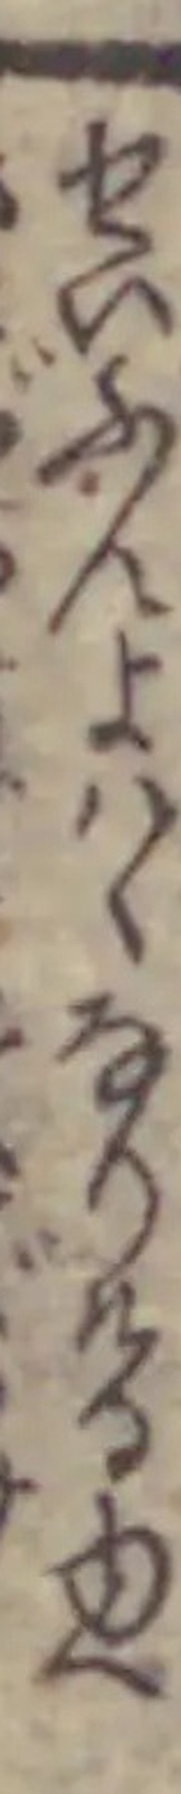せいぶんよはくなりけるゆへ
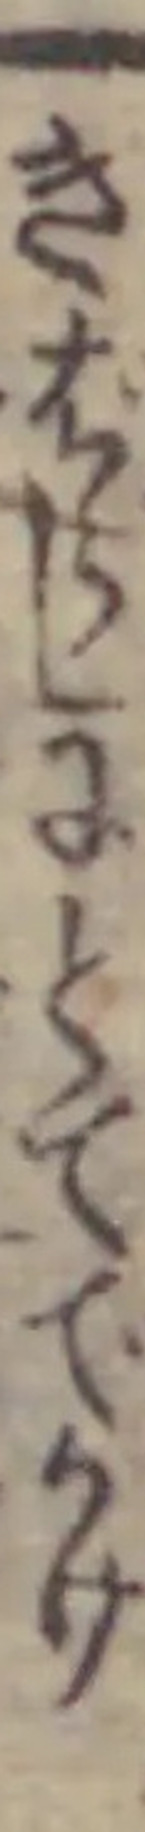きばらしにとてでかけ
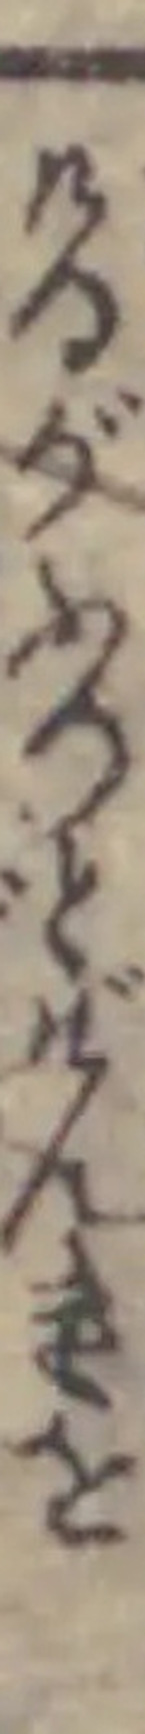けるがふつとげんきを
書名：腹内養生主論 3巻
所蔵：国立国会図書館 National Diet Library, JAPAN
